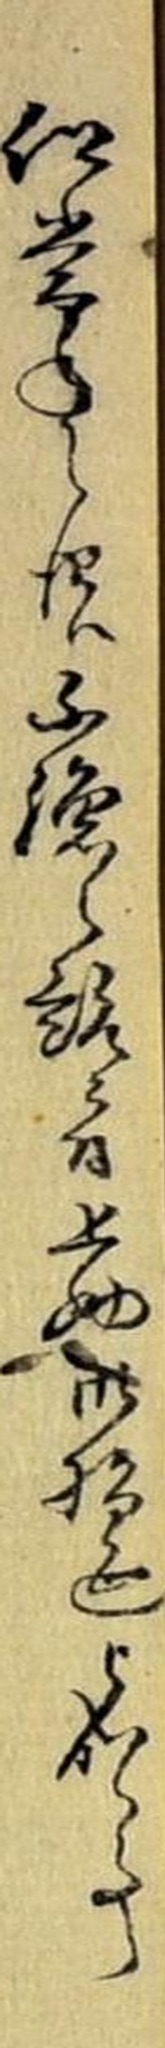但当年之儀は不漁之趣に付上納御指延被成候事
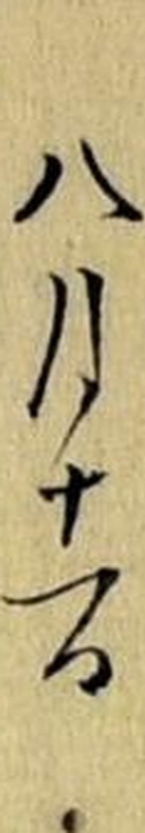八月十一日

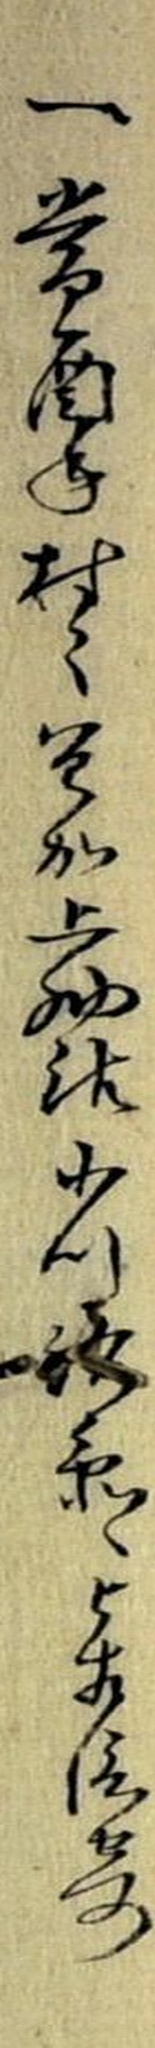一当酉年村々冥加上納銀小川治兵衛へ被相渡寄
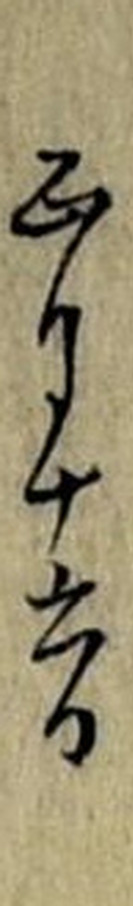正月十六日
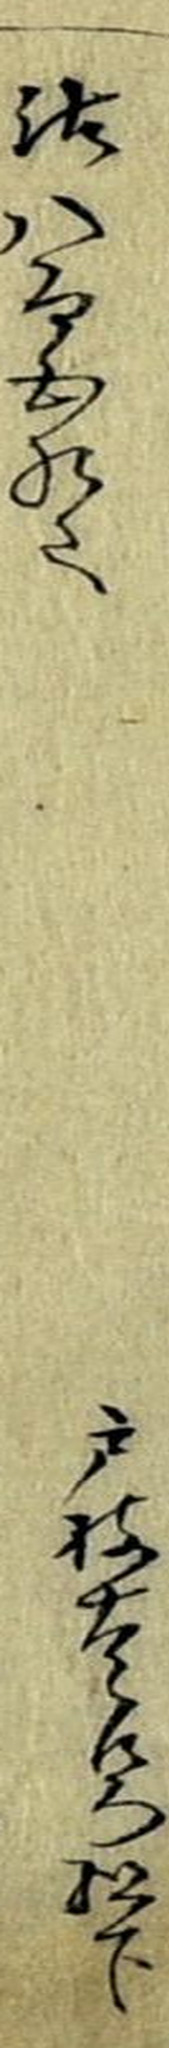銀八百五拾匁戸枝太郎左衛門組下
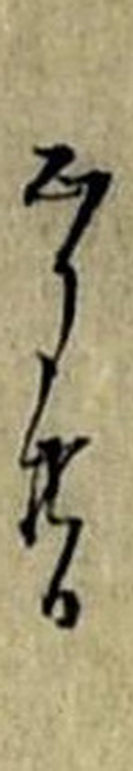正月廿日
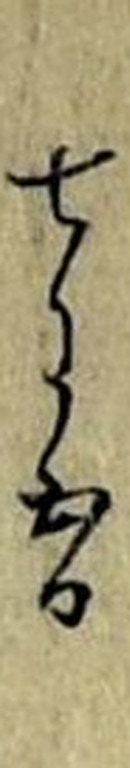七月五日
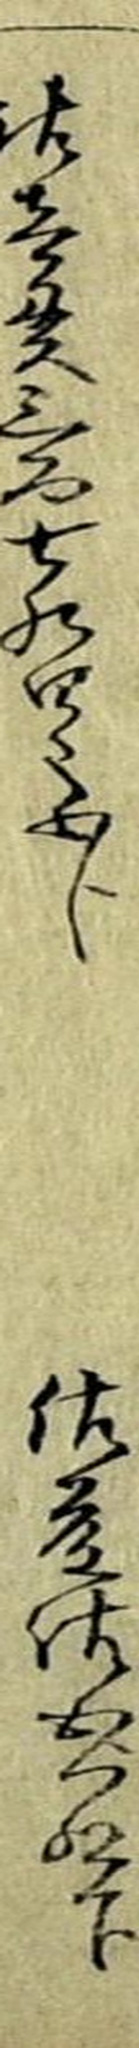銀壱貫三百七拾四匁五分佐藤佐五右衛門組下
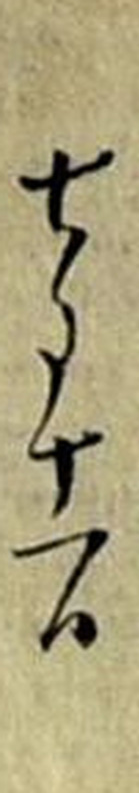七月十一日
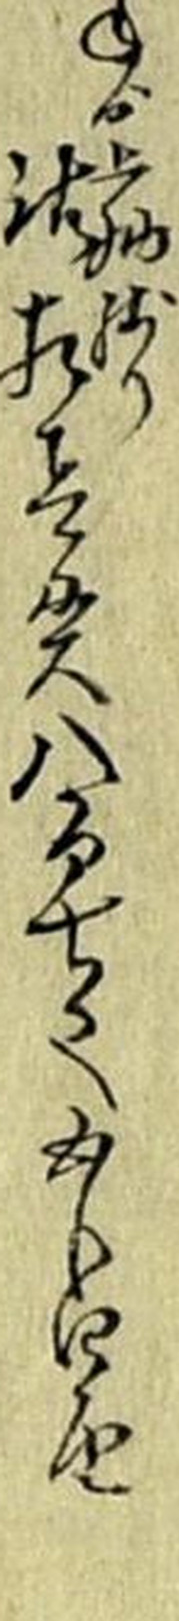銀拾壱貫八百七匁五分四厘村々
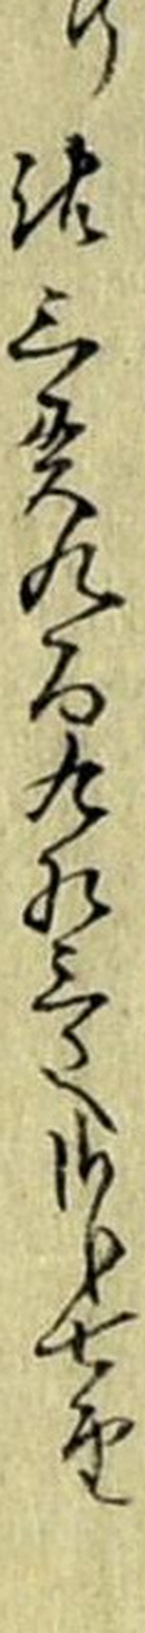銀三貫九百九拾参匁弐分七厘村々
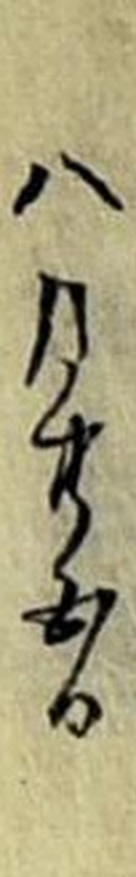八月廿五日
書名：命令之部 六
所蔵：福井県文書館 Fukui Prefectural Archives
